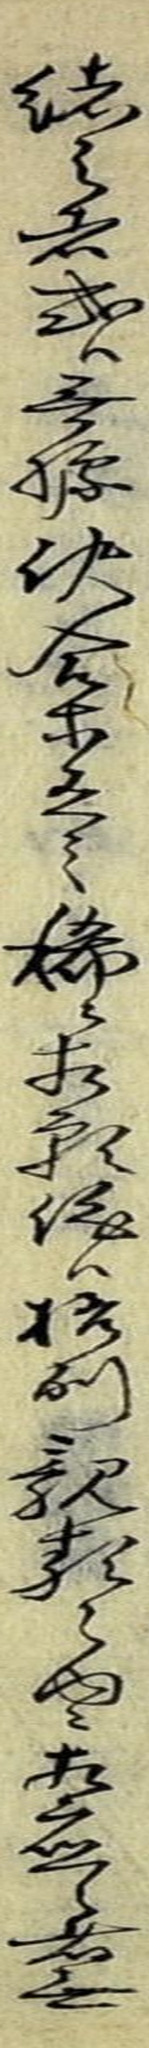緒之者或ハ無拠訳合等有之稀ニ相願儀ハ格別親類之内ニ相応之者無
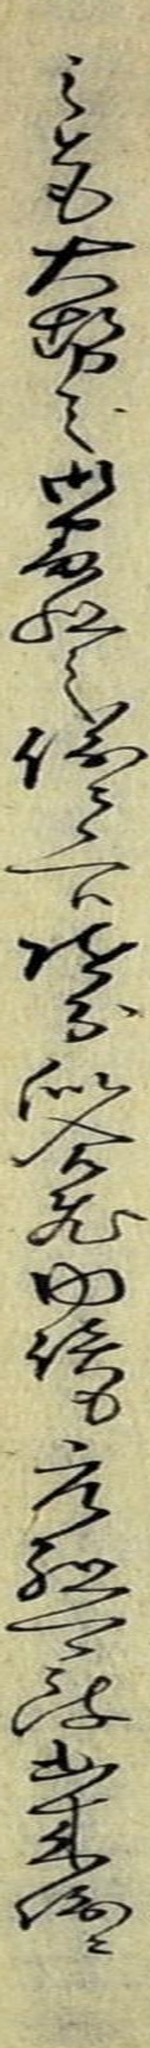之とも大勢之御番組之儀ニ候ヘハ随分似合敷内談も取組可致出来儀ニ
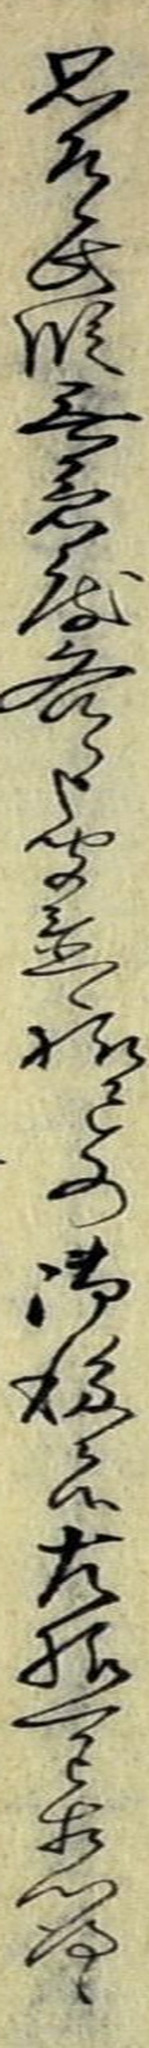思召候此段無急度各へ申聞置候様ニとの御移ニ候左様可被相心得候
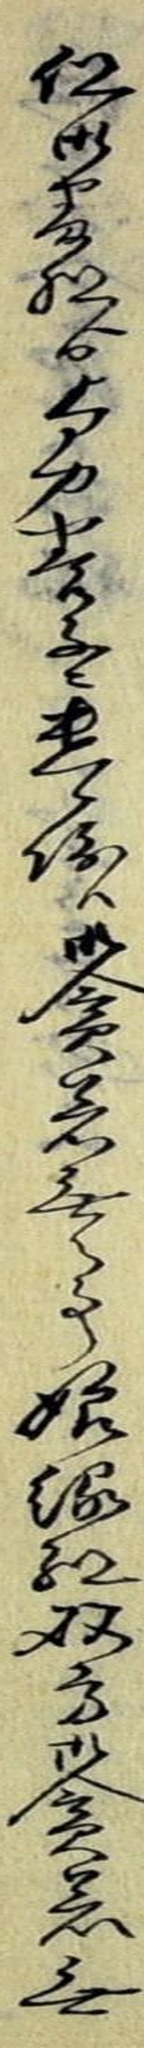但御番組ゟ与力養子ニ遣候儀ハ御貪着無之事娘縁組双方御貪着無
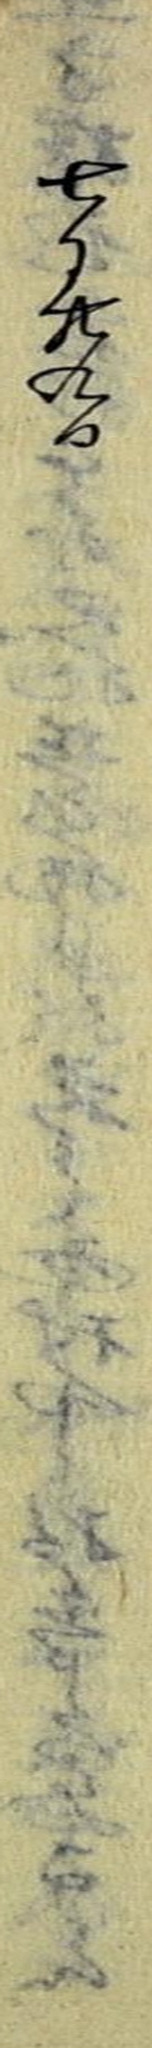七月廿九日
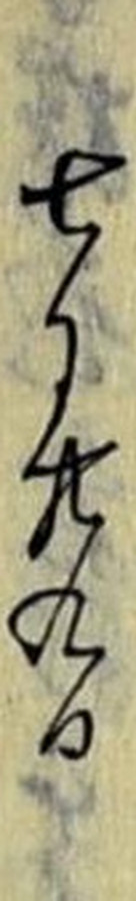七月廿九日
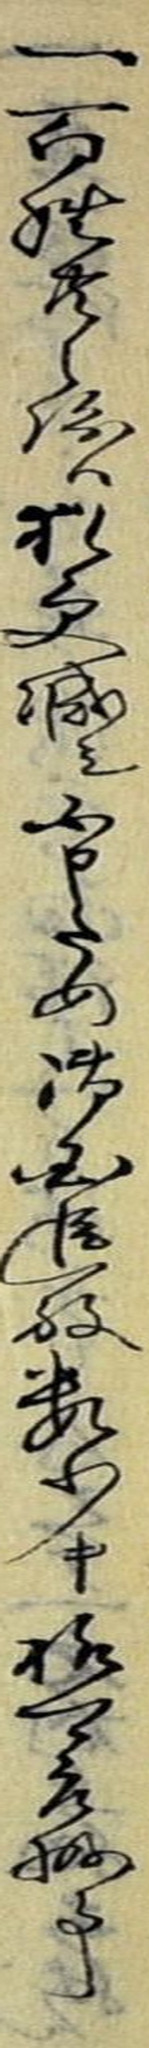一百姓共之儀ハ猶更減シ不申ため御国追放数少キ様可取扱事
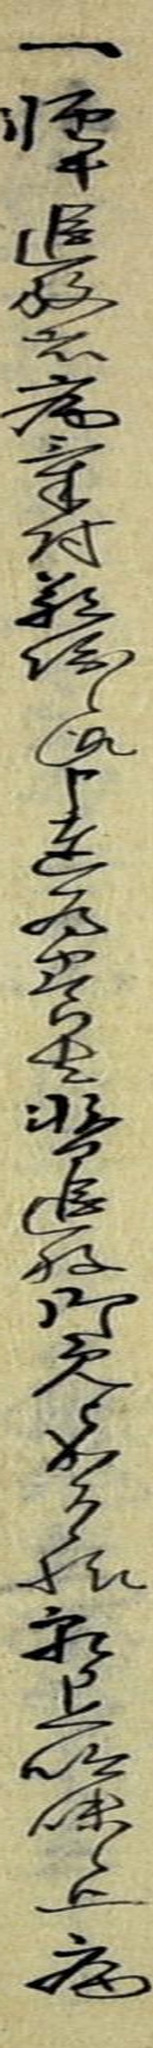一軽キ追放者病気付難儀之趣申達為養生暫追放御免被成下候様願申上吟味之上病
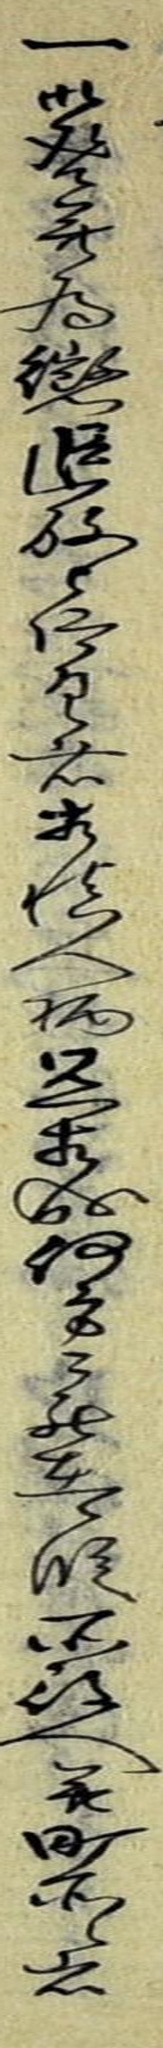一御咎并為懲追放被仰付候者相慎人柄宜相成何方ニ罷在候段所役人并町所之者
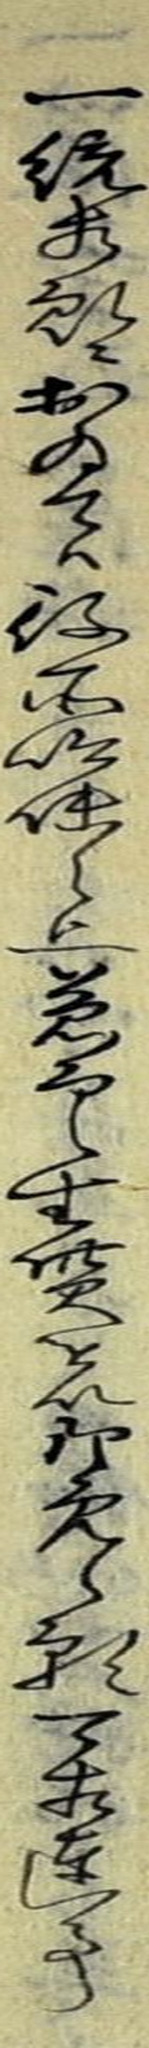一統相願ニおゐてハ役所吟味之上兼而之生質を以御免之類可相達事
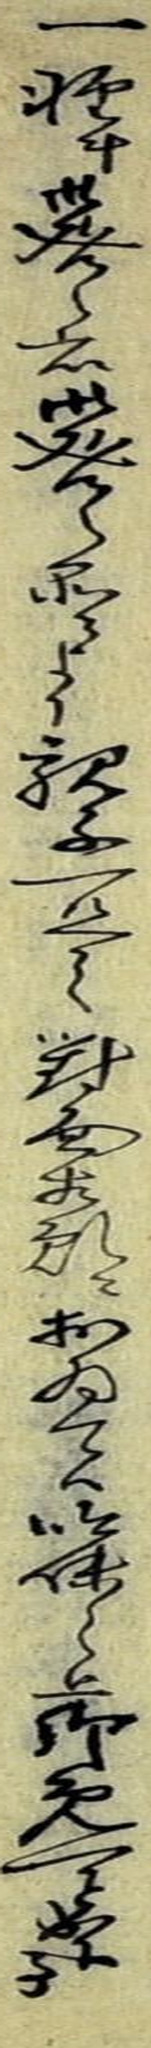一軽キ御咎之者御咎之品ニより親子一旦之対面相願ニおゐてハ吟味之上御免可被成下事
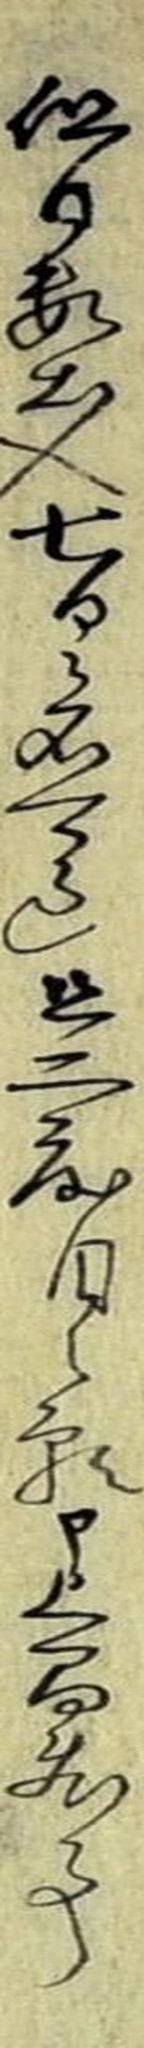但日数出入七日ニ不可過且二度目之願申上間敷事
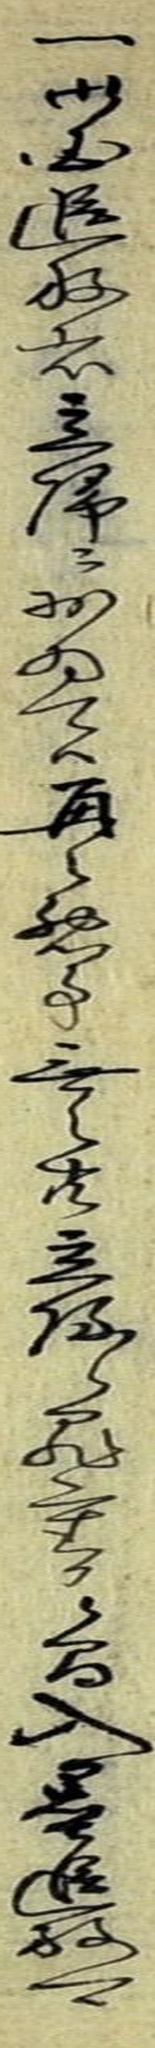一御国追放者立帰ニおゐてハ再之悪事無之共立帰候罪重ク候間入墨追放可
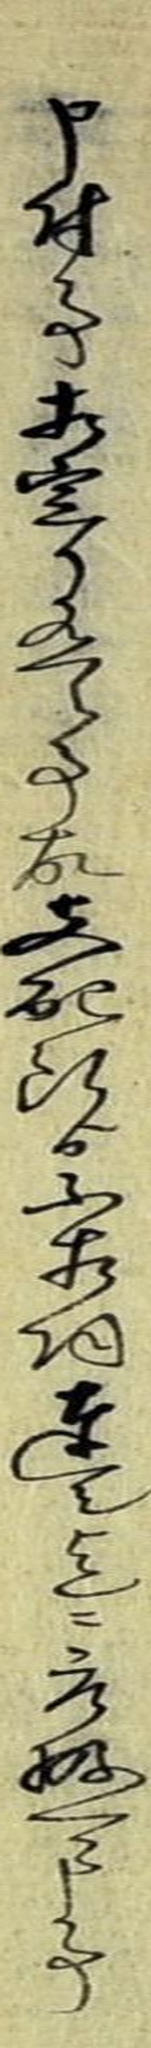申付事相定り有之事故支配頭ゟ不相伺達シ迄ニ取扱可申事
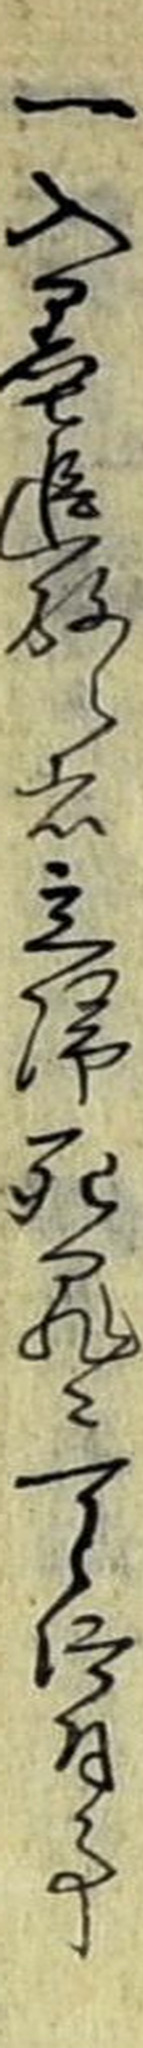一入墨追放之者立帰死罪ニ可被仰付事
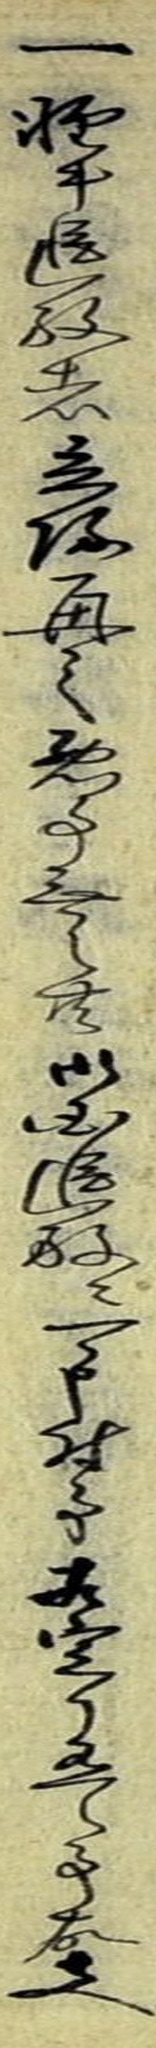一軽キ追放者立帰再之悪事無之共御国追放ニ可申付事相定り有之事故支
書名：命令之部 三
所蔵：福井県文書館 Fukui Prefectural Archives
